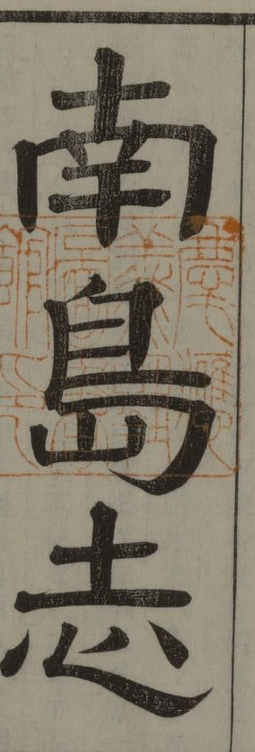南島志

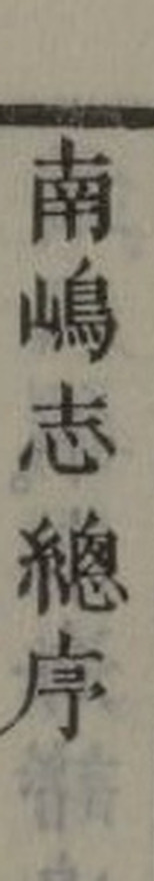南嶋志總序
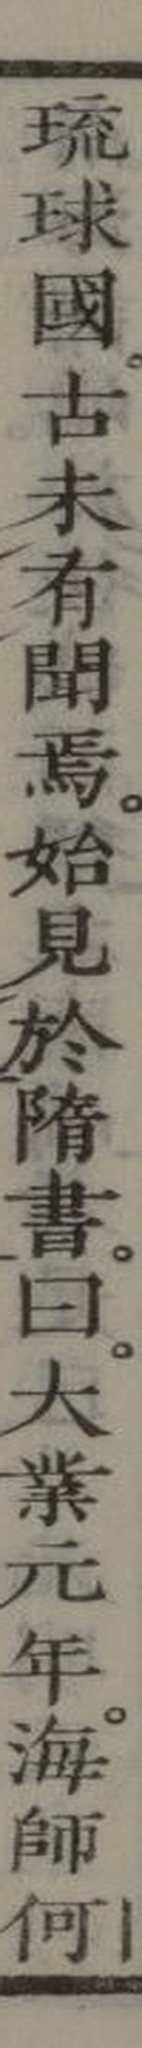琉球國。古未有聞焉。始見於隋書。曰。大業元年。海師何
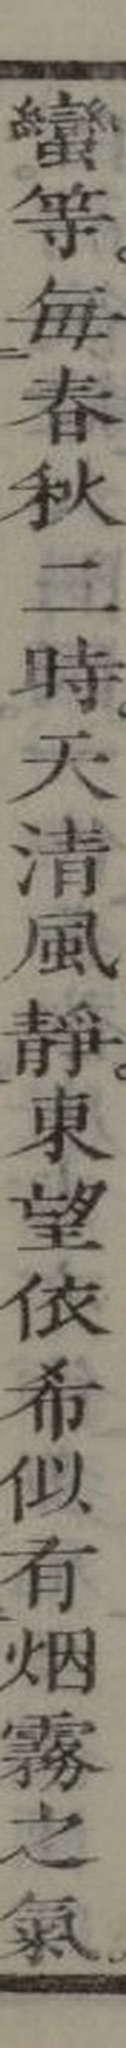蠻等。毎春秋二時。天清風靜。東望依希似有烟霧之氣。
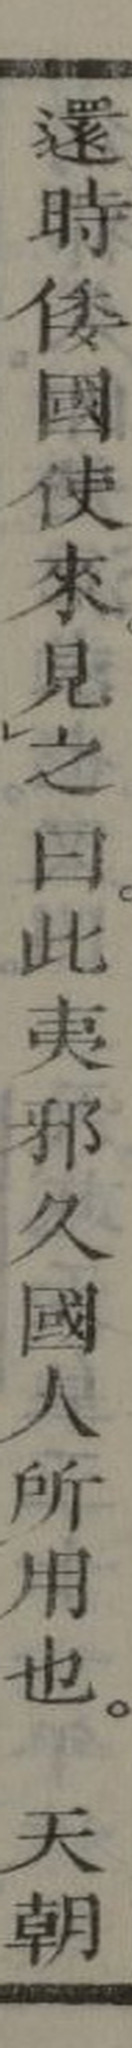還。時倭國使來。見之曰。此夷邪久國人所用也。天朝
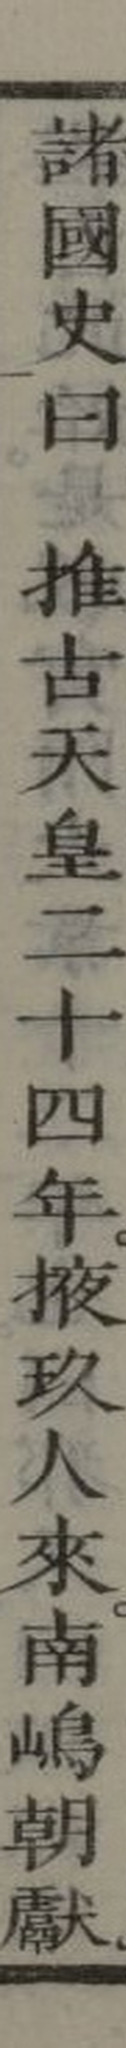諸國史。曰。推古天皇二十四年。掖玖人來。南嶋朝獻。

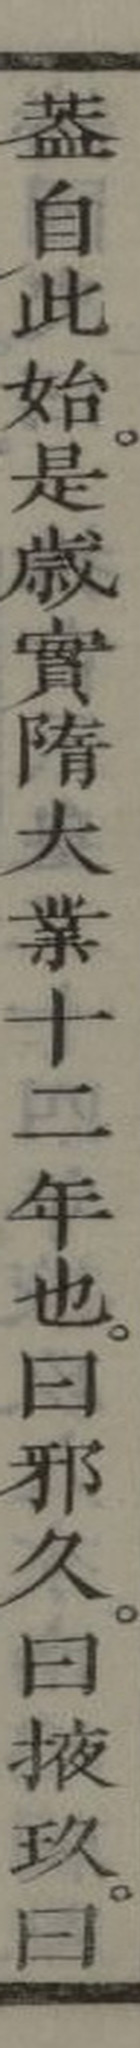葢自此始。是歳實隋大業十二年也。曰邪久。曰掖玖。曰
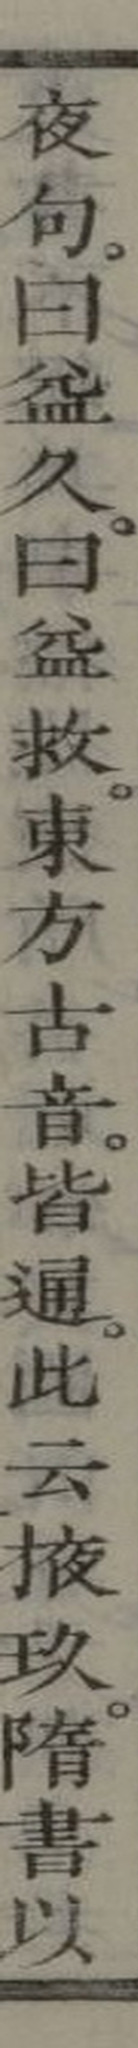夜句。曰益久。曰益救。東方古音。皆通。此云掖玖。隋書以
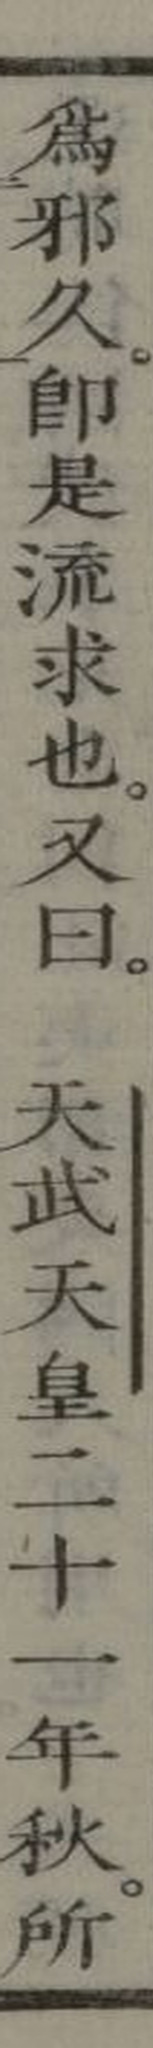爲邪久。卽是流求也。又曰。天武天皇二十一年秋。所
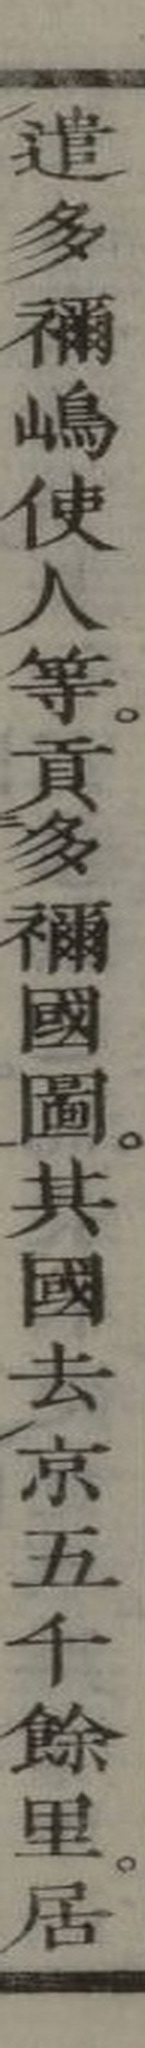遣多禰嶋使人等。貢多禰國圖。其國去京五千餘里。居
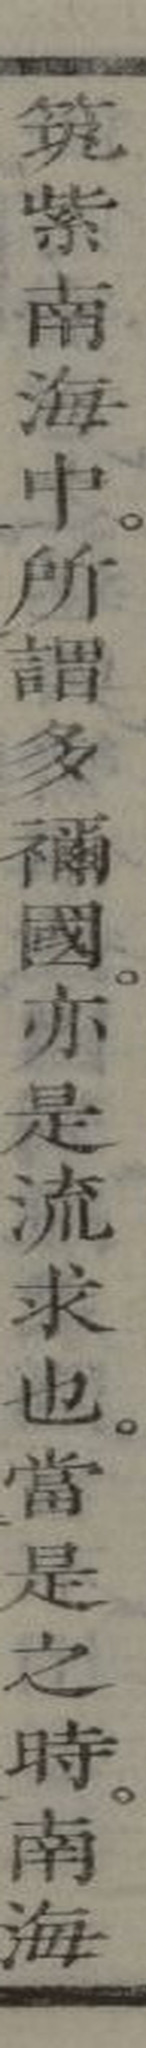筑紫南海中。所謂多禰國。亦是流求也。當是之時。南海
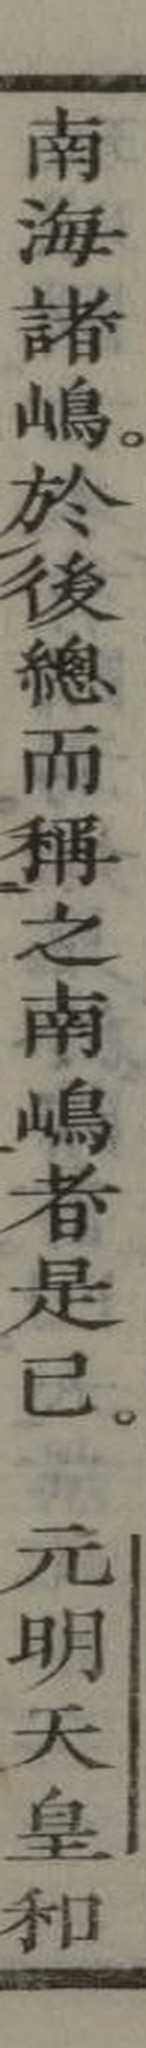南海諸嶋。於後總而稱之南嶋者是已。元明天皇和
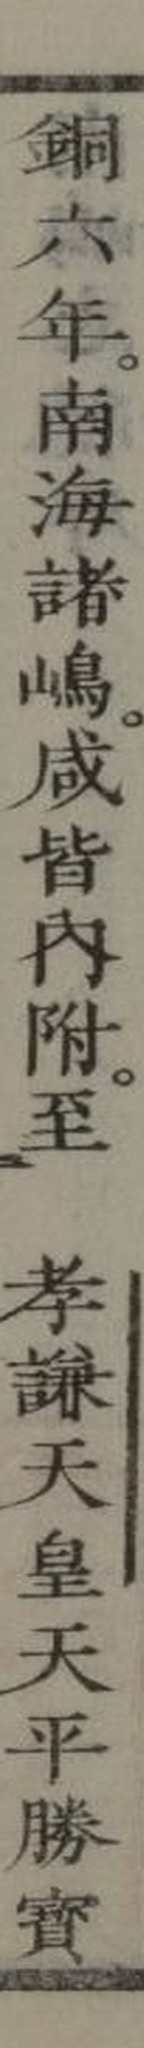銅六年。南海諸嶋。咸皆内附。至孝謙天皇天平勝寳
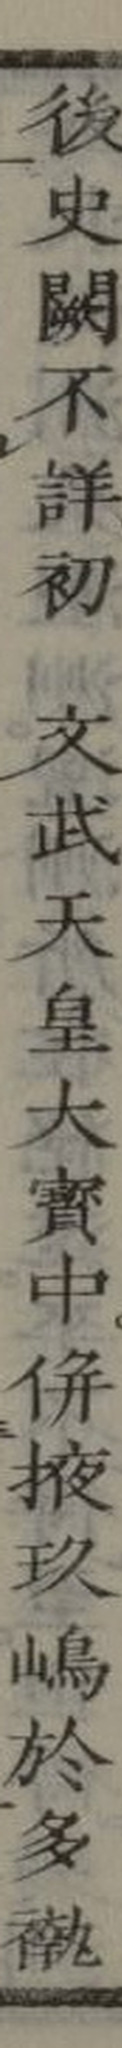後。史闕不詳。初文武天皇大寳中。併掖玖嶋於多褹
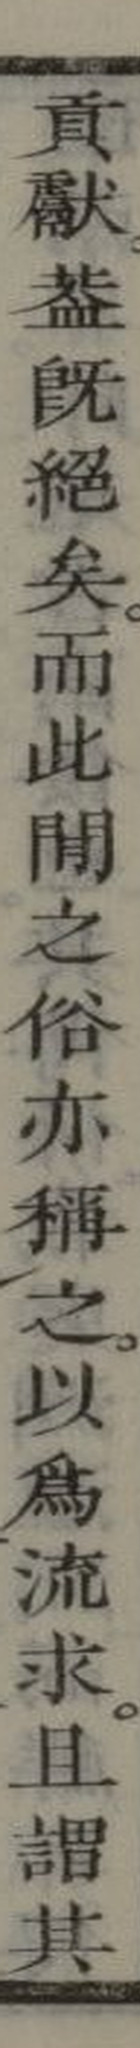貢獻。葢既絕矣。而此閒之俗亦稱之。以爲流求。且謂其
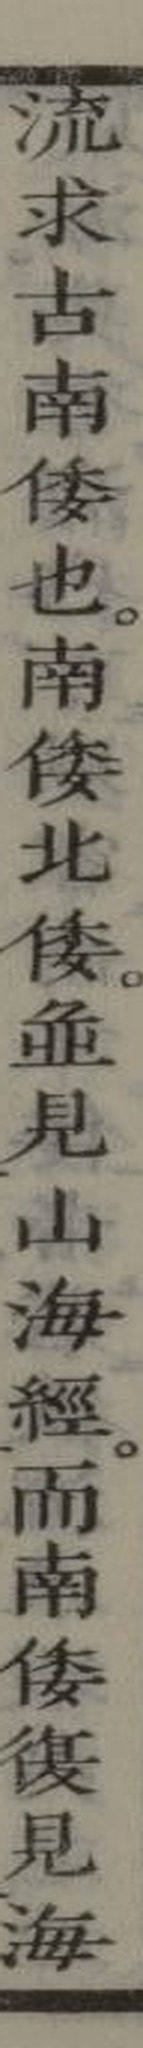流求古南倭也。南倭北倭。並見山海經。而南倭復見海
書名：南島志 呂
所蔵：University of the Ryukyus Library
